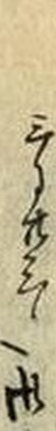三月廿三日
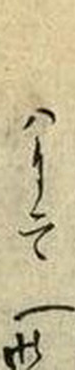八月二日
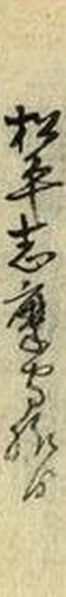松平志摩守様ゟ
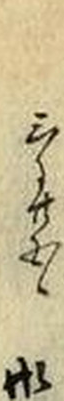三月廿五日
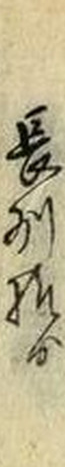長州様ゟ
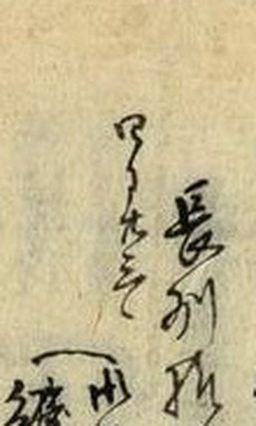四月廿三日
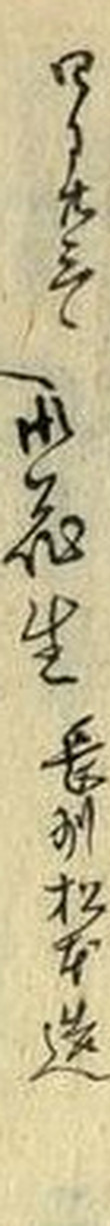御花生長州松本造
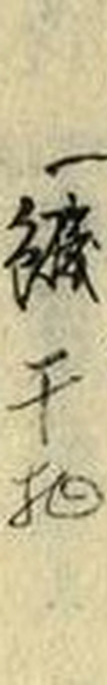鰔干物
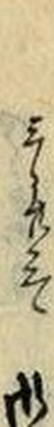三月廿三日
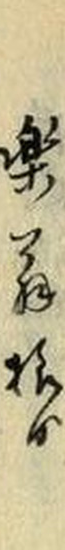楽翁様ゟ
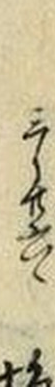三月廿六日
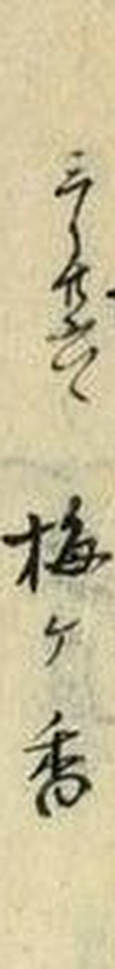三月廿六日
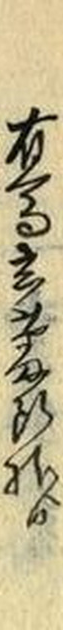有馬玄蕃頭様ゟ
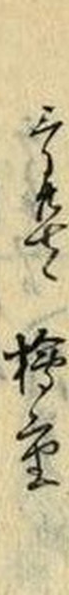三月廿七日
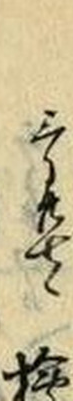三月廿七日
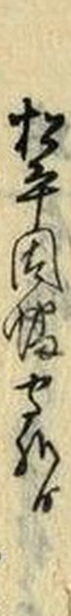松平因幡守様ゟ
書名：少傅日録抄（斉承付側向頭取日記、在府）
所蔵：福井県文書館 Fukui Prefectural Archives
